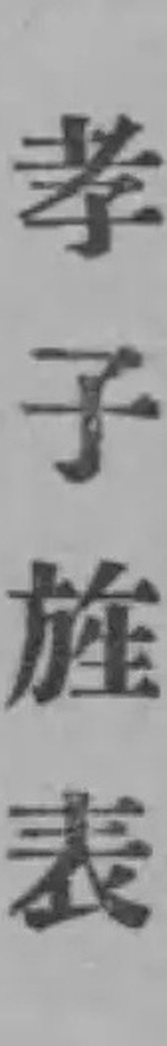孝子旌表
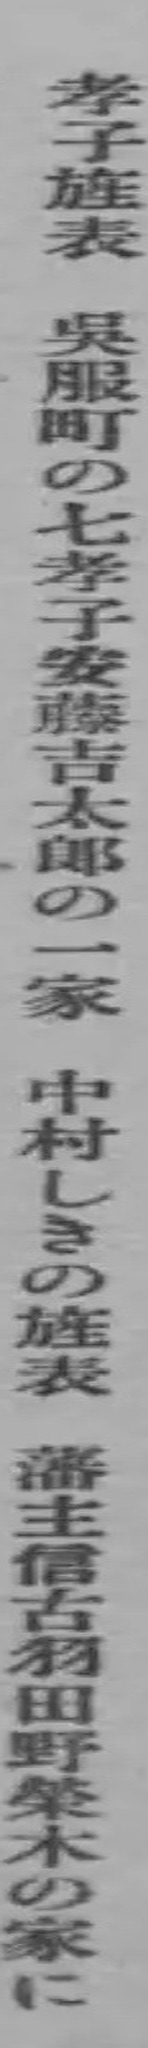孝子旌表呉服町の七孝子安藤吉太郎の一家中村しきの旌表藩主信古羽田野栄木の家に
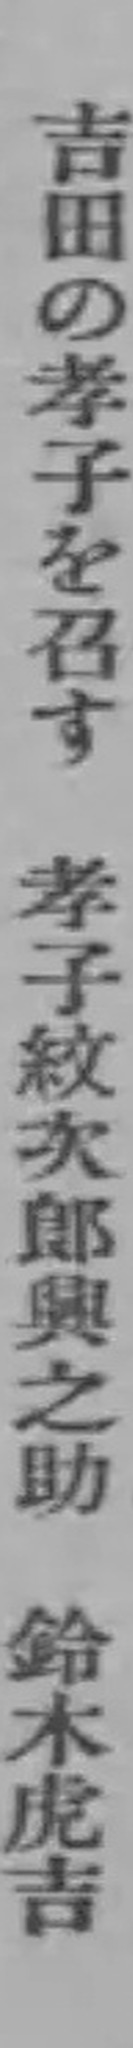吉田の孝子を召す孝子紋次郎与之助鈴木虎吉
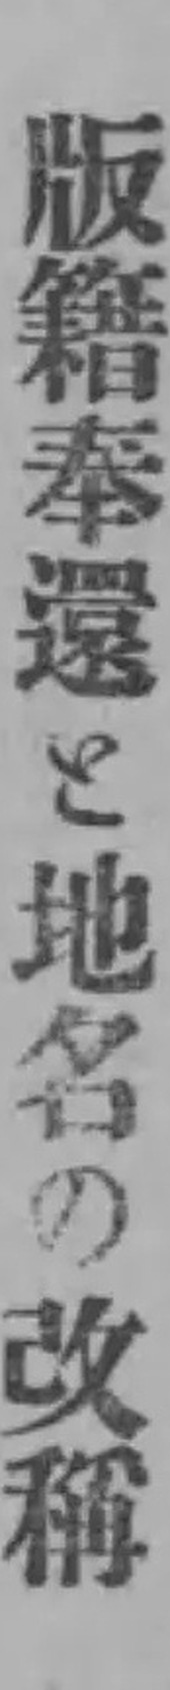版籍奉還と地名の改称
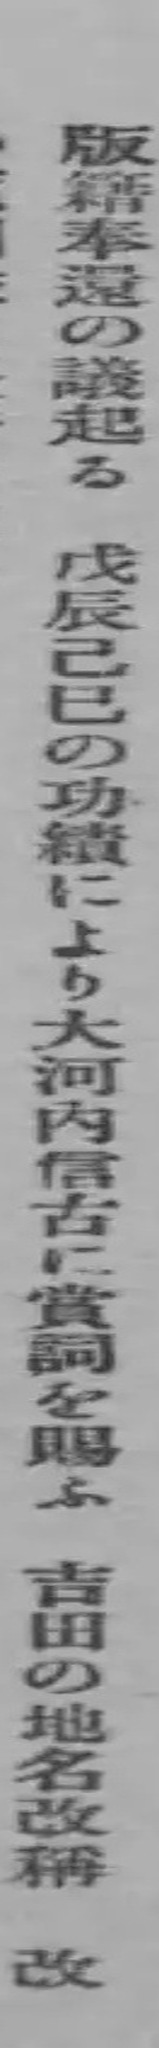版籍奉還の議起る戊辰己巳の功績により大河内信古に賞詞を賜ふ吉田の地名改称改
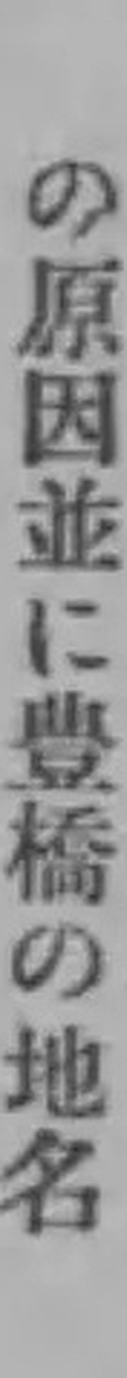の原因並に豊橋の地名
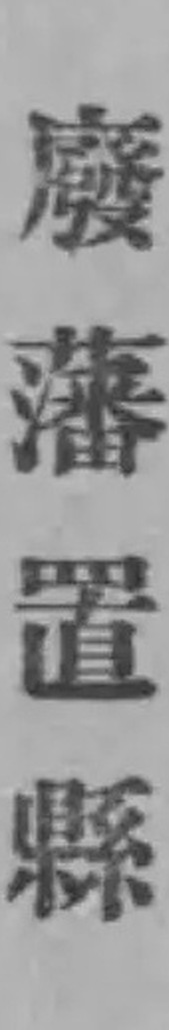廃藩置県
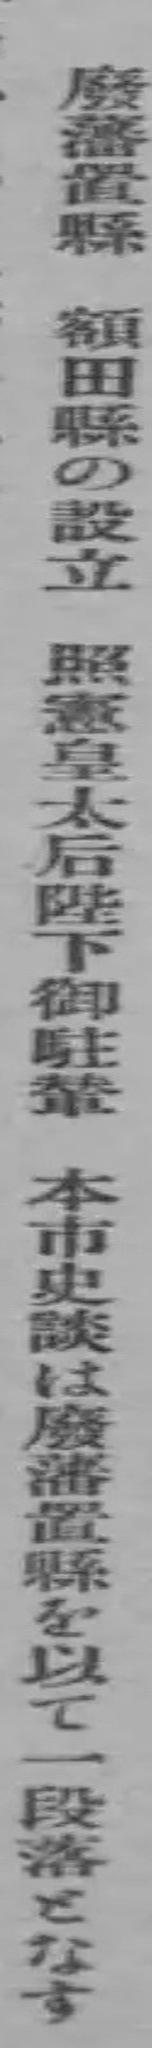廃藩置県額田県の設立照憲皇太后陛下御駐輦本市史談は廃藩置県を以て一段落となす
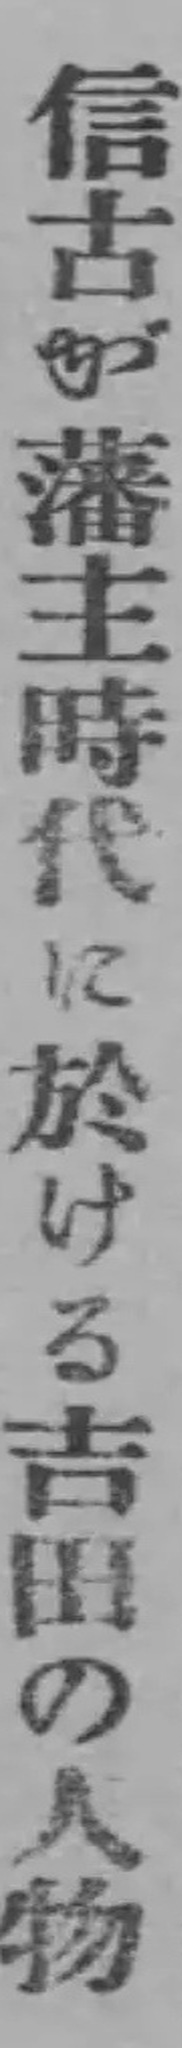信古が藩主時代に於ける吉田の人物
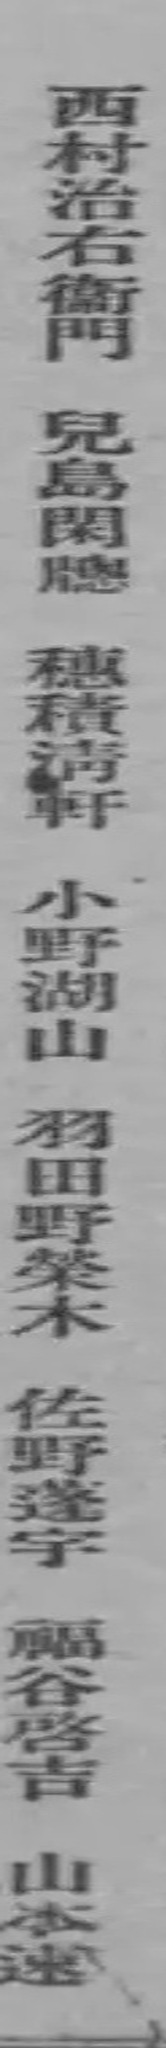西村治右衛門児島閑牕穂積清軒小野湖山羽田野栄木佐野蓬宇福谷啓吉山本速
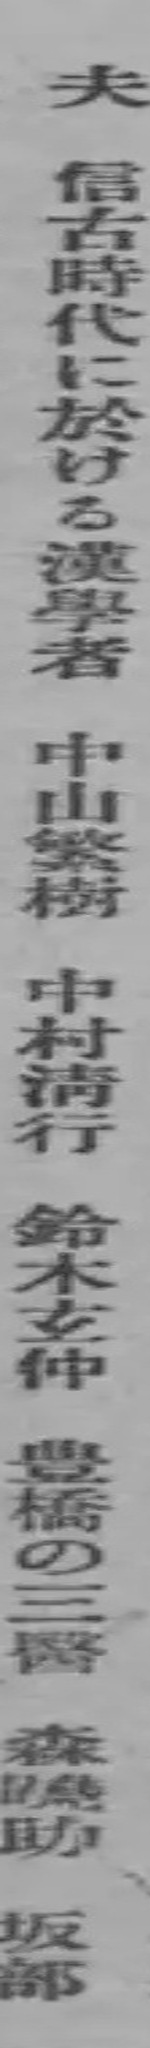夫信古時代に於ける漢学者中山繁樹中村清行鈴木玄仲豊橋の三医森暁助坂部
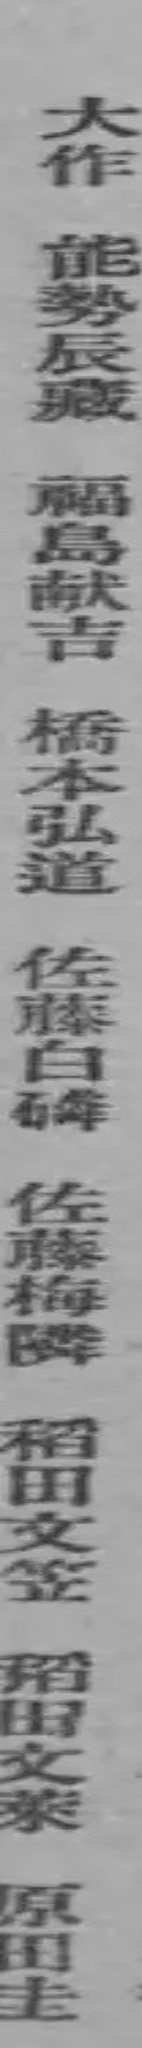大作能勢辰蔵福島献吉橋本弘道佐藤白磷佐藤梅隣稲田文笠稲田文萊原田圭
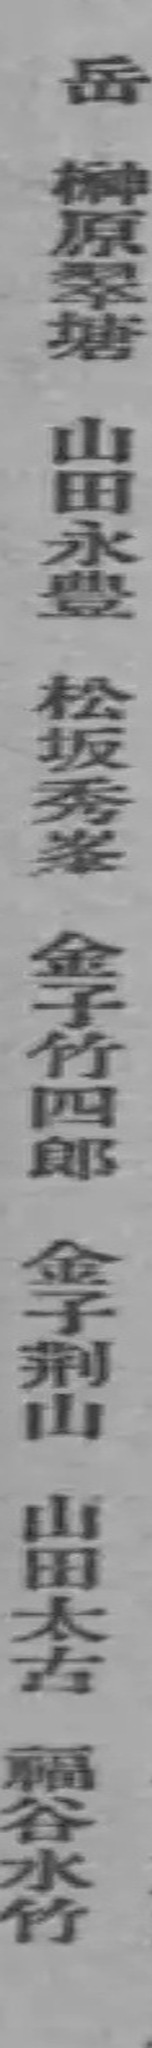岳榊原翠塘山田永豊松坂秀峯金子竹四郎金子荊山山田太古福谷水竹

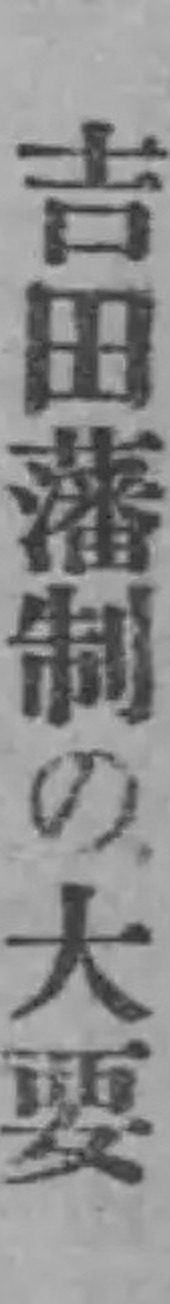吉田藩制の大要
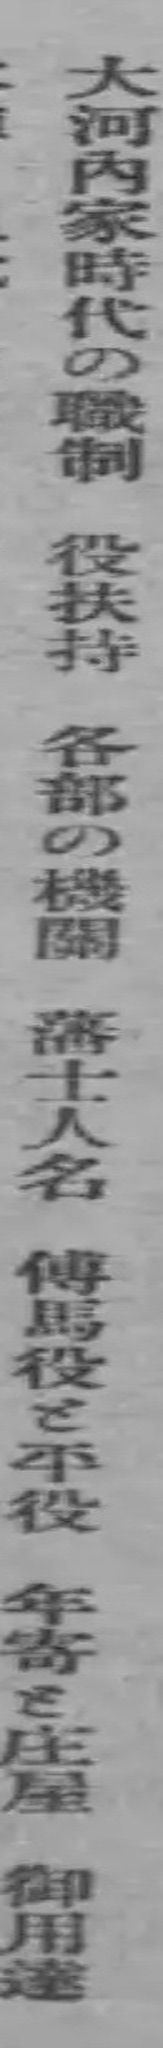大河内家時代の職制役扶持各部の機関藩士人名伝馬役と平役年寄と庄屋御用達
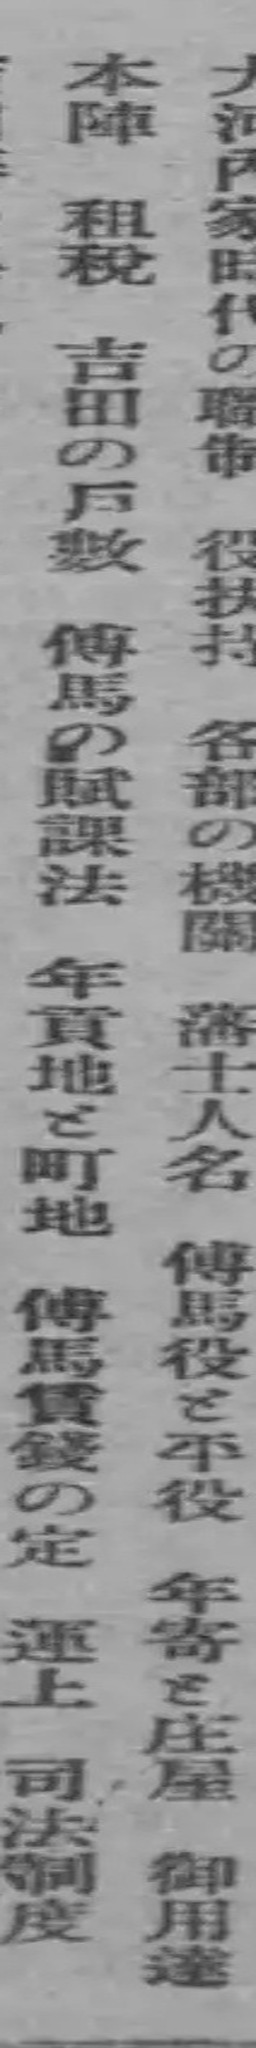本陣租税吉田の戸数伝馬の賦課法年貢地と町地伝馬賃銭の定運上司法制度
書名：豊橋市史談
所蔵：国立国会図書館 National Diet Library, JAPAN
